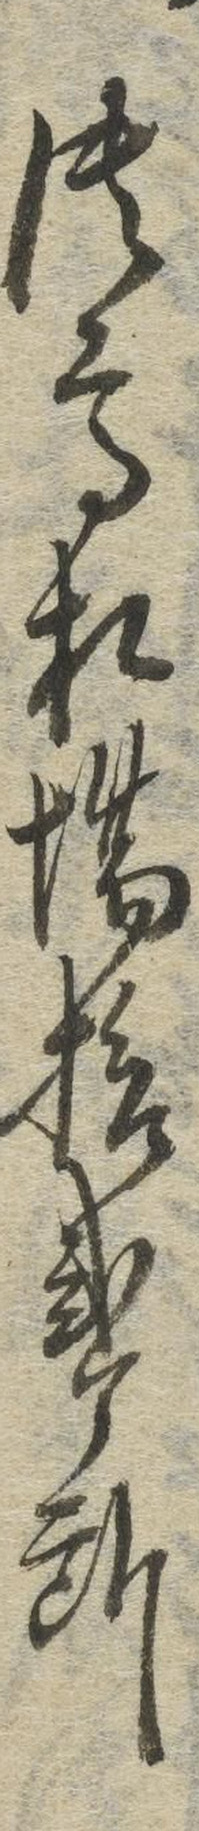潰高札場拾弐ヶ所
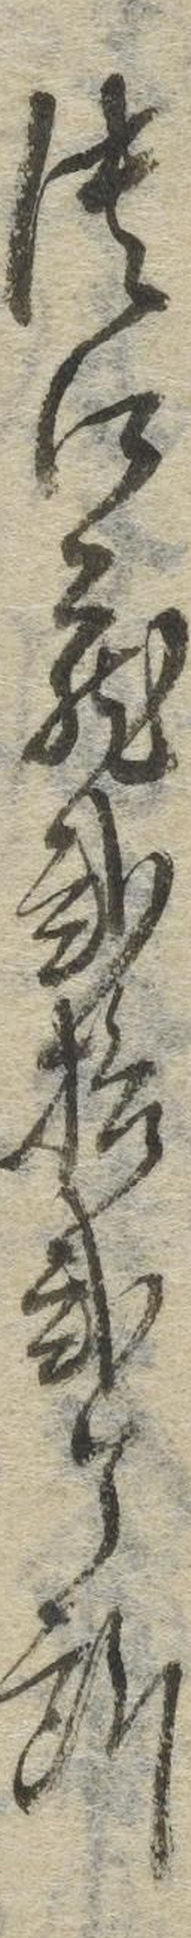潰郷蔵弐拾弐ヶ所
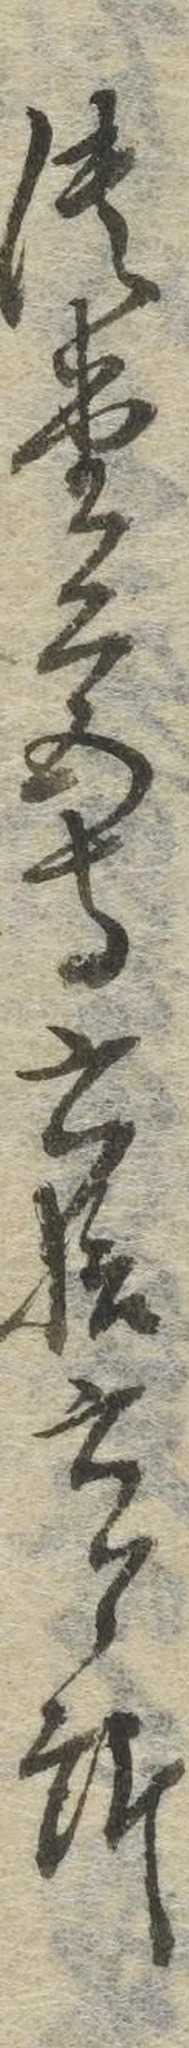潰堂宮寺六拾六ヶ所
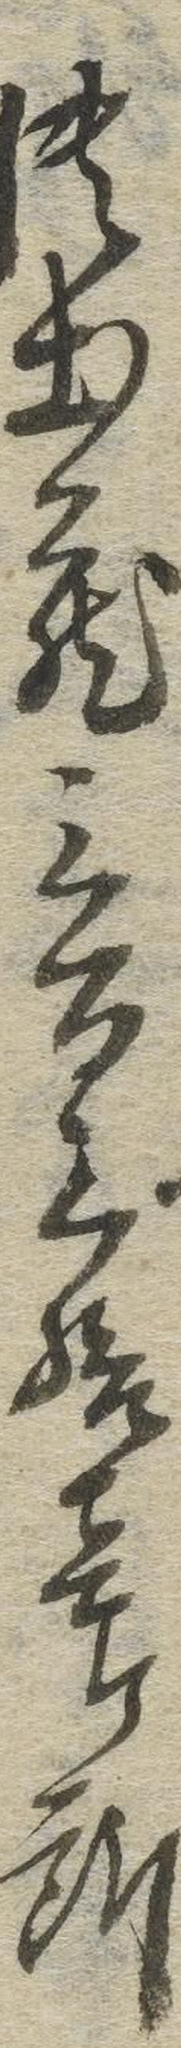潰土蔵三百三拾壱ヶ所
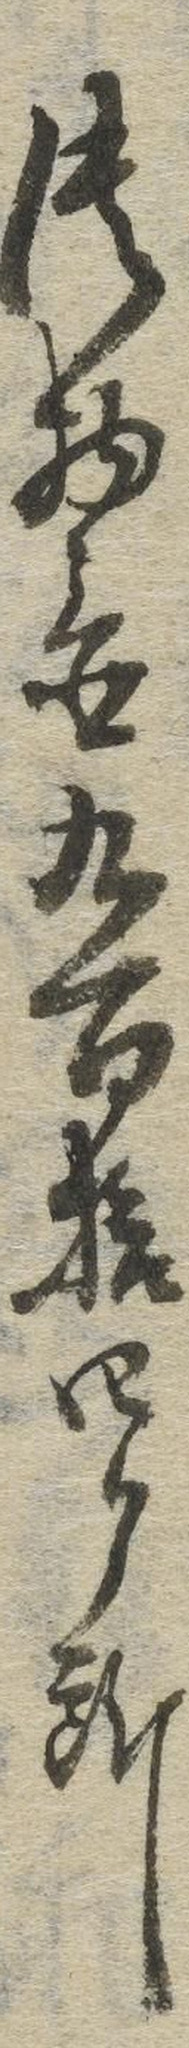潰物置九百拾四ヶ所
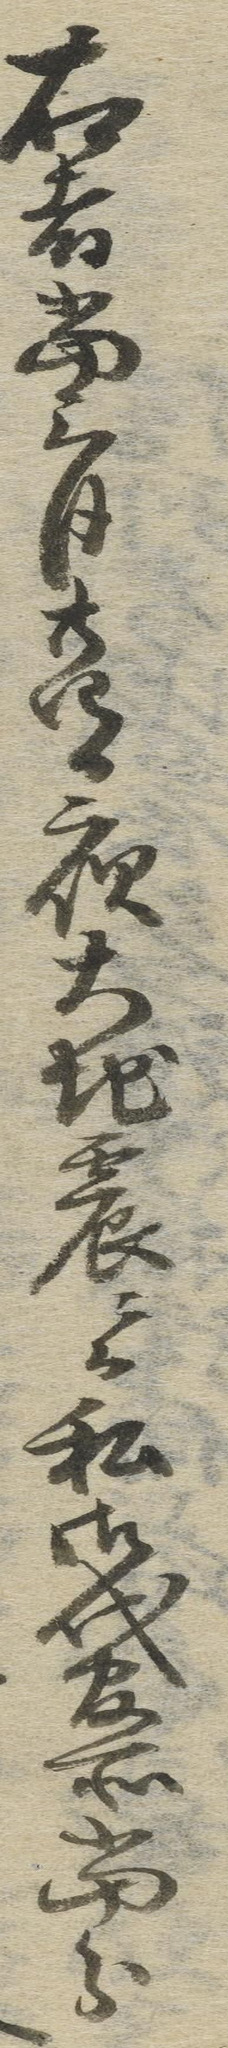右は当三月廿四日夜大地震二而私御代官所当分
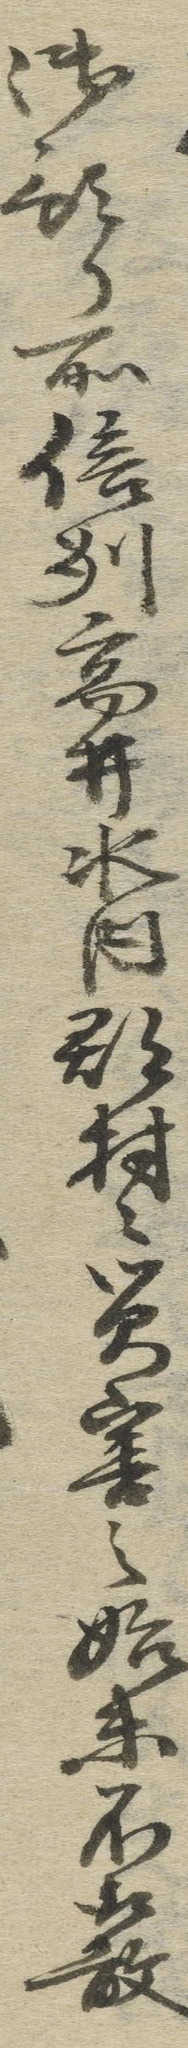御預り所信州高井郡水内郡村々災害之始末不取敢
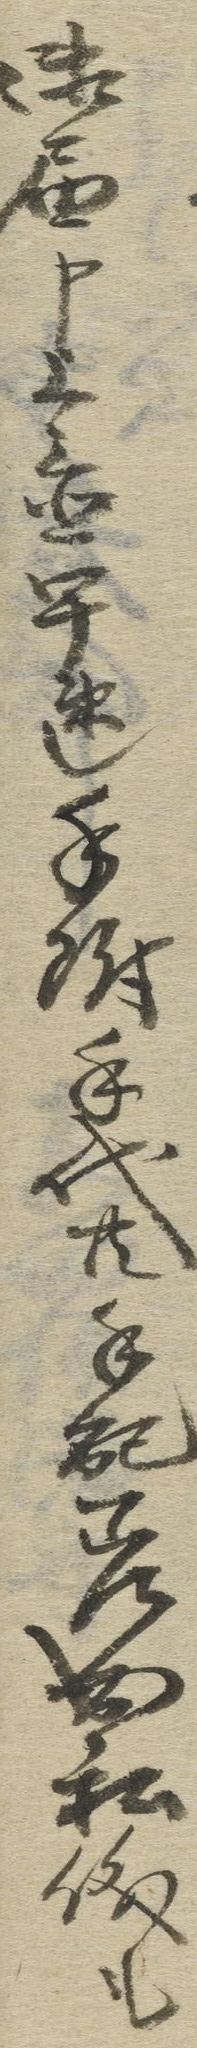御届申上置早速手附手代共手配差出私儀も
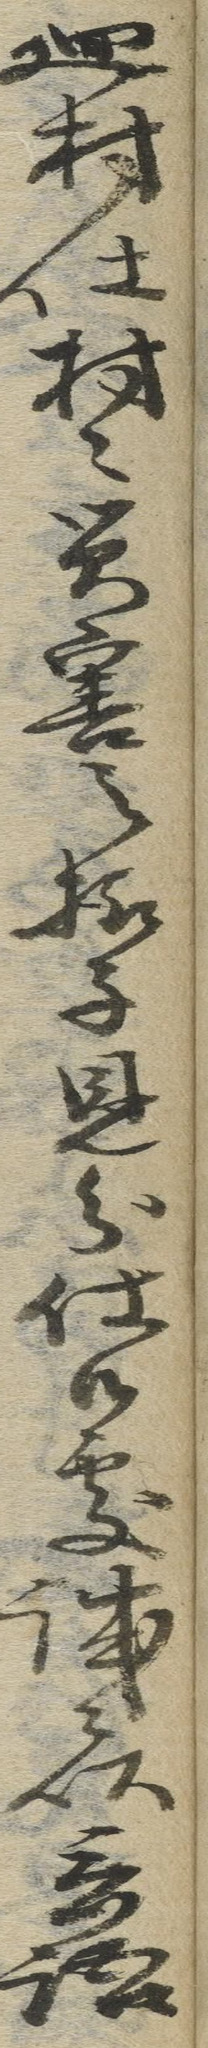廻村仕村々災害之様子見分仕候処誠二以言語
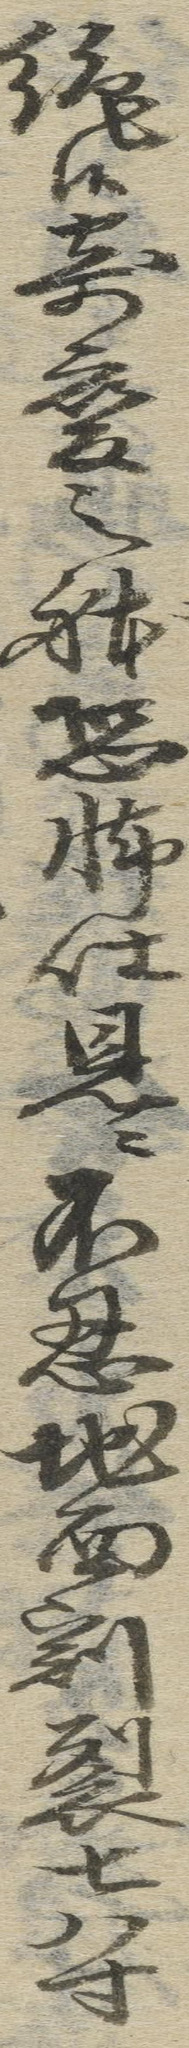絶候奇変之躰恐怖仕見二不忍地面割裂七八寸
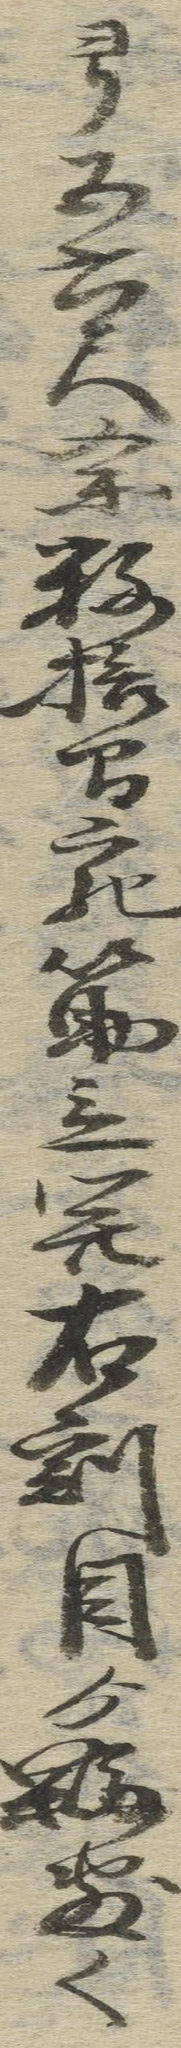ヨリ五六尺余数拾間宛筋立開右割目ゟ夥敷く
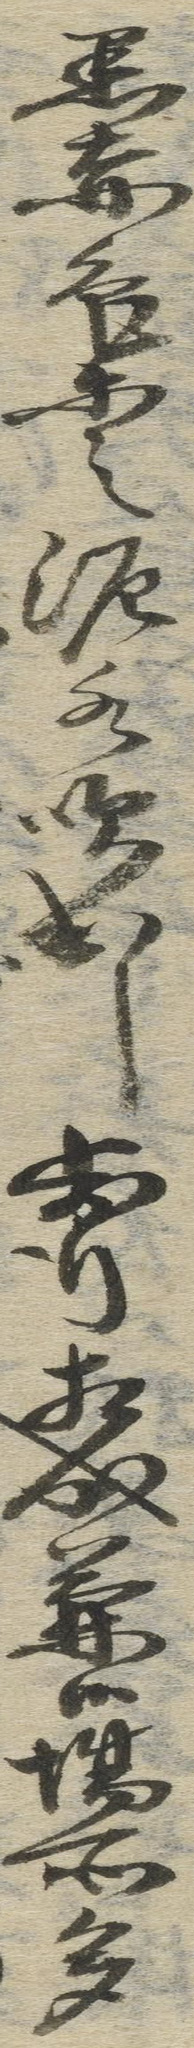黒赤色等之泥水吹出し歩行相成兼候場所多
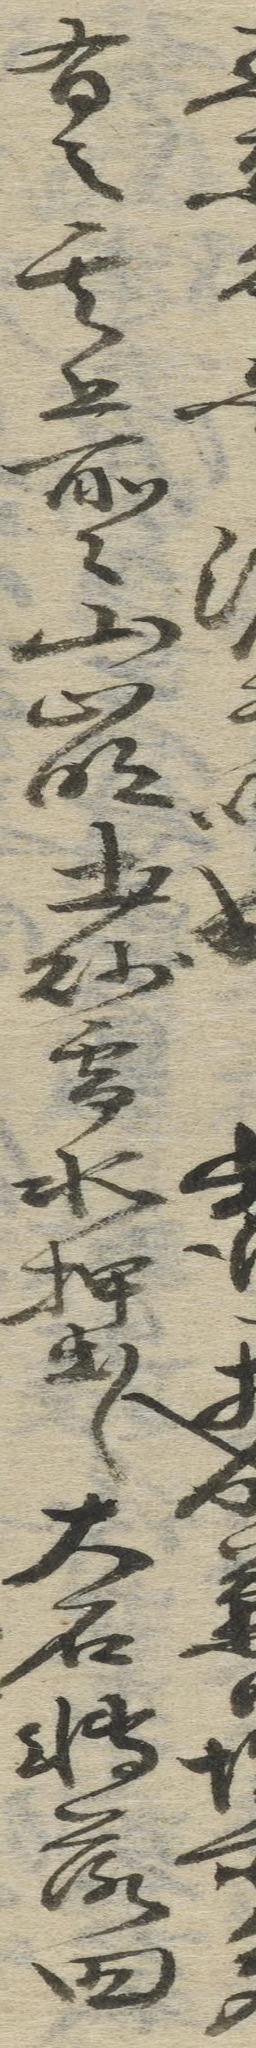有之其上所々山崩土砂雪水押出し大石転落流田
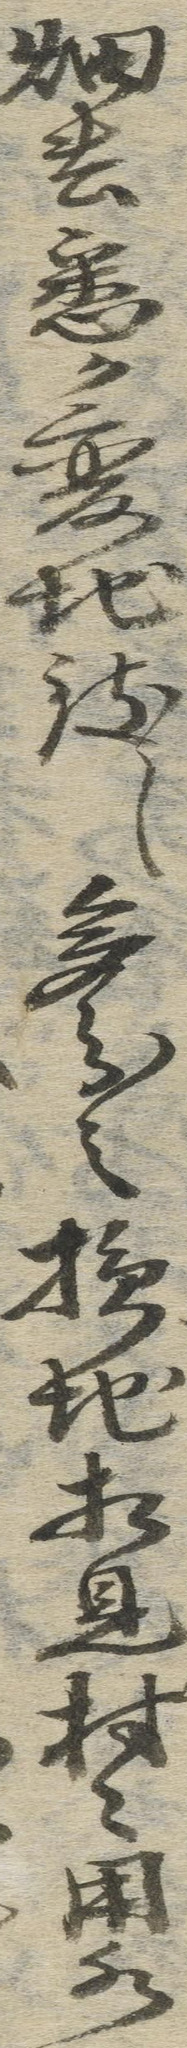畑共悉ク変地致し多分之損地相見村々水
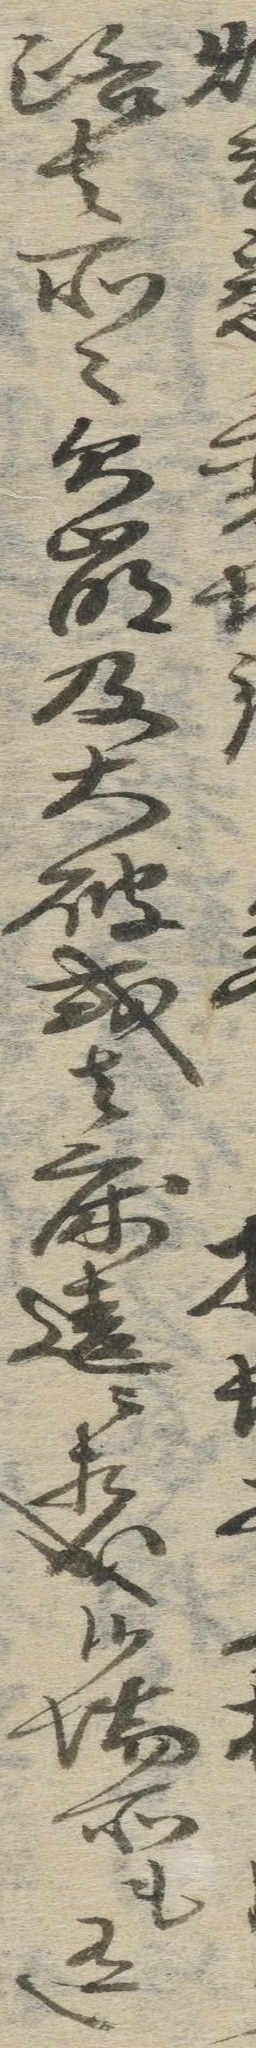路は諸々欠崩及大破或は床違二相成候場所も有之
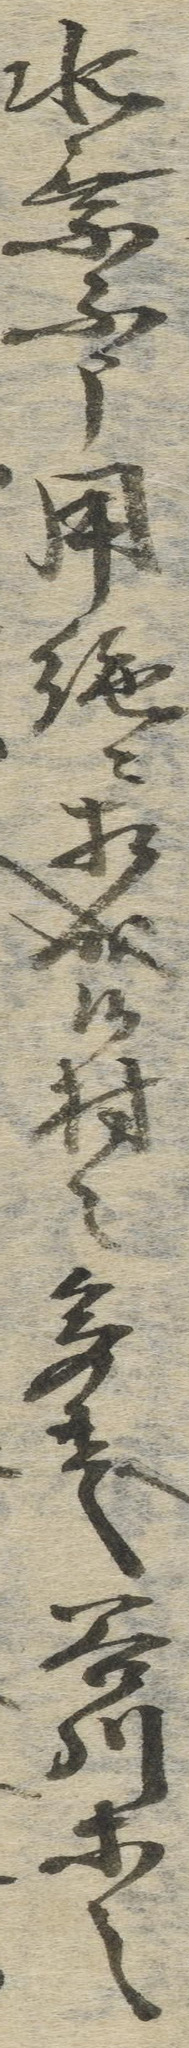水乗不申用絶二相成候村々多有之谷川等之
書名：信濃越後　地震書留
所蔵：東京大学地震研究所図書室 Earthquake Research Institute Library, The University of Tokyo, JAPAN
